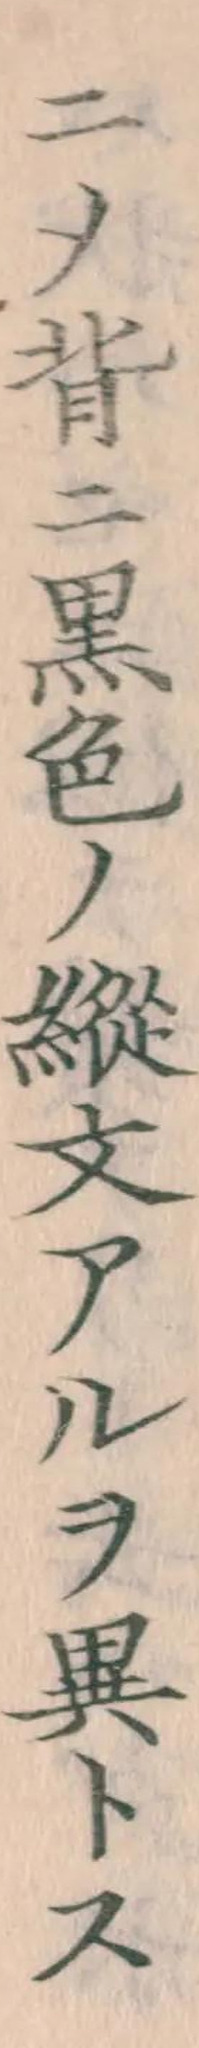ニシテ背ニ黒色ノ縦文アルヲ異トス
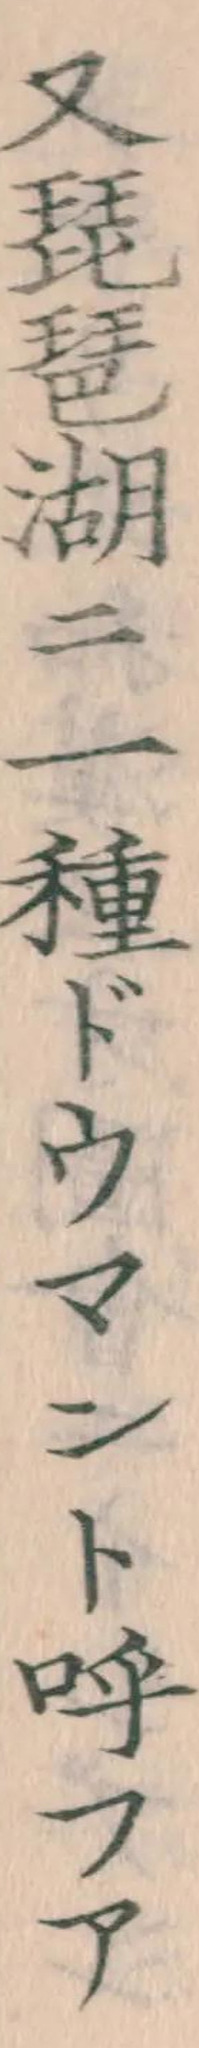又琵琶湖ニ一種ドウマント呼フア
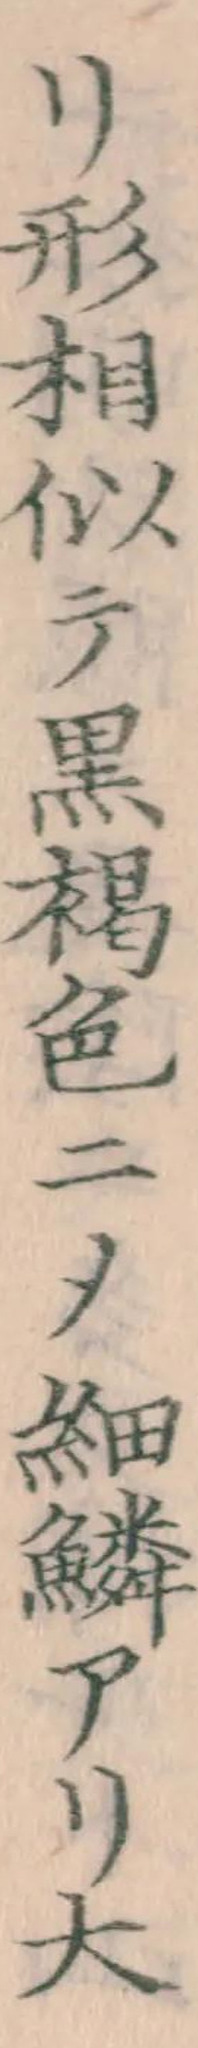リ形相似テ黒褐色ニシテ細鱗アリ大
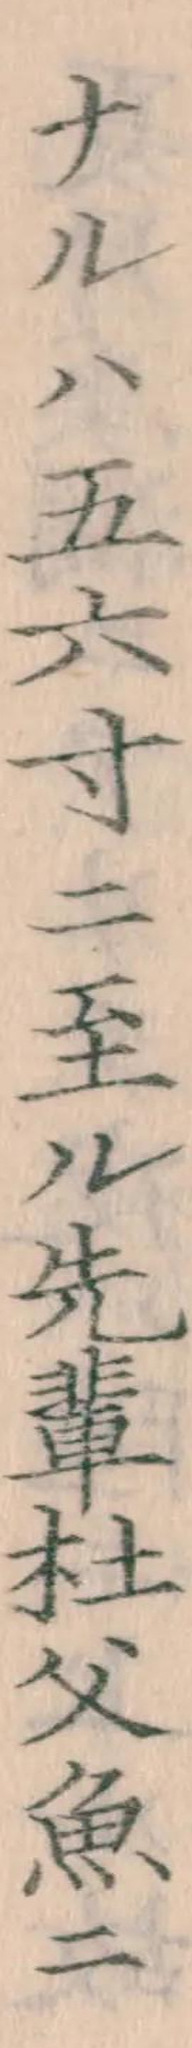ナルハ五六寸ニ至ル先輩杜父魚ニ
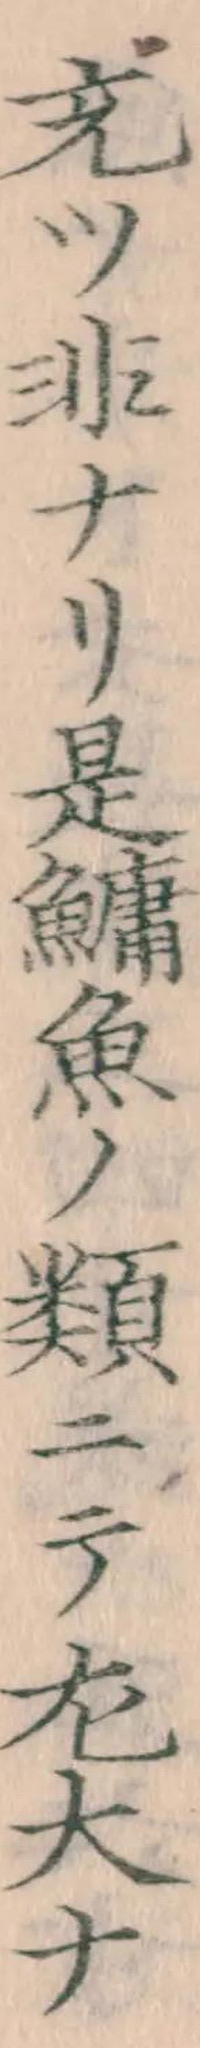充ツ非ナリ是鱅魚ノ類ニテ左大ナ
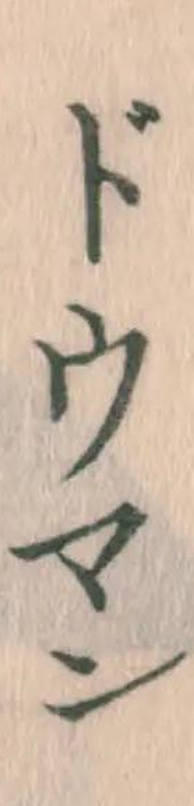ドウマン
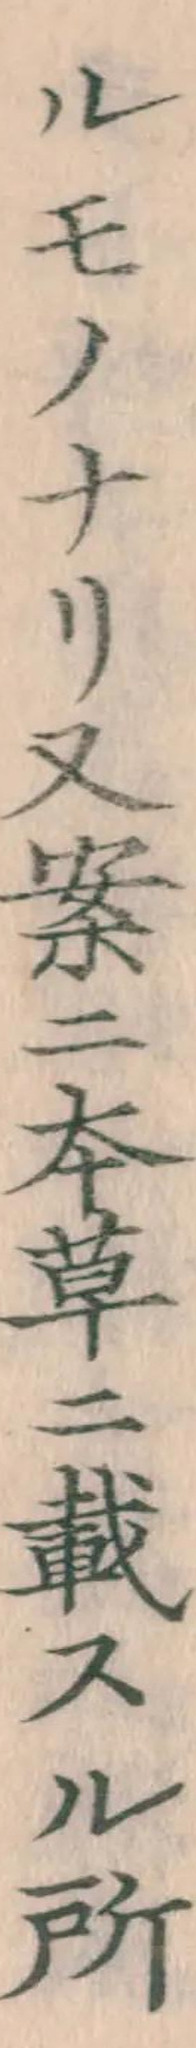ルモノナリ又案ニ本草ニ載スル所
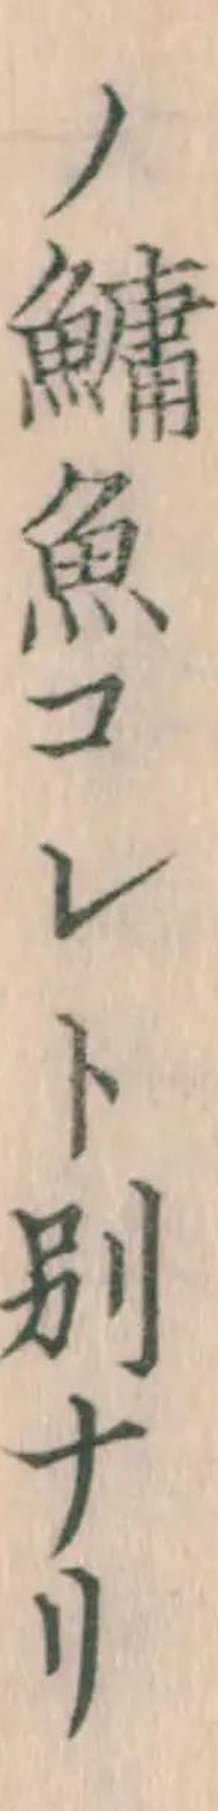ノ鱅魚コレト別ナリ

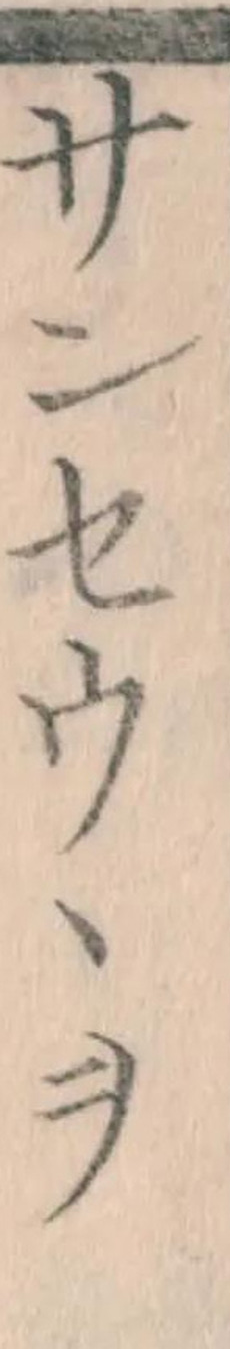サンセウヽヲ
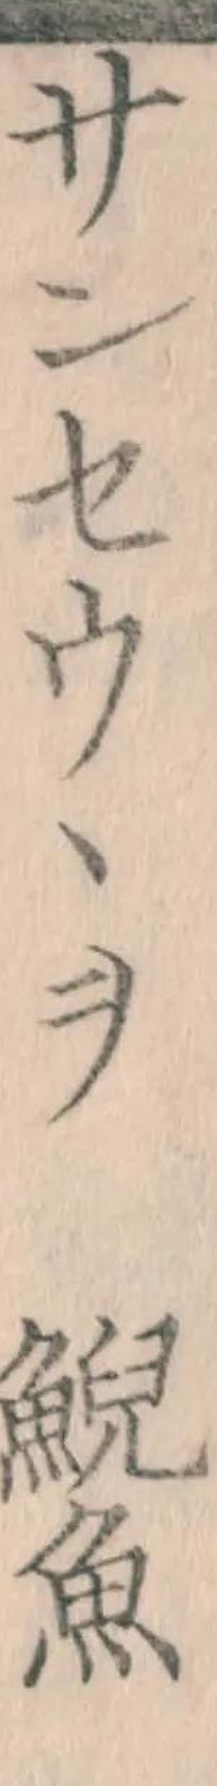サンセウヽヲ鯢魚
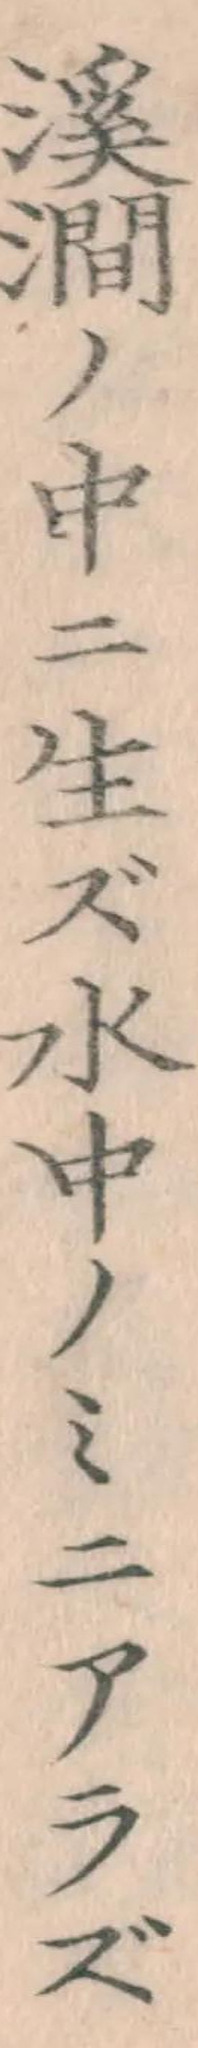渓澗ノ中ニ生ズ水中ノミニアラズ
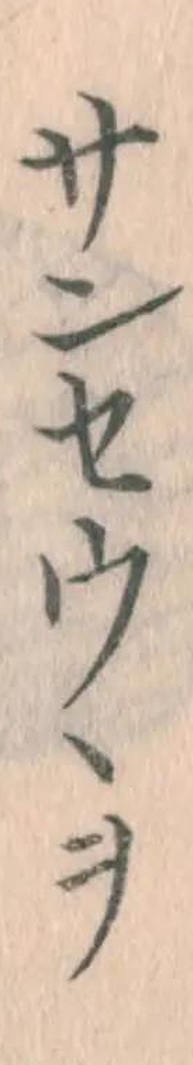サンセウヽヲ
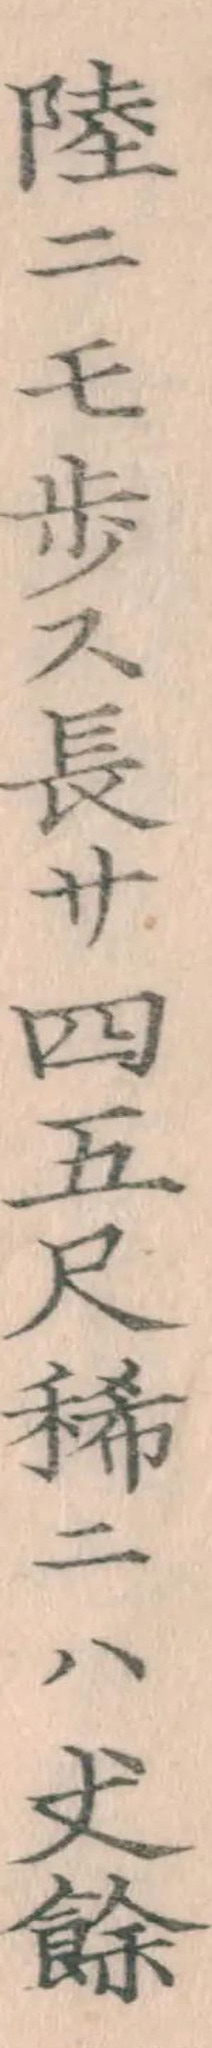陸ニモ歩ス長サ四五尺稀ニハ丈余
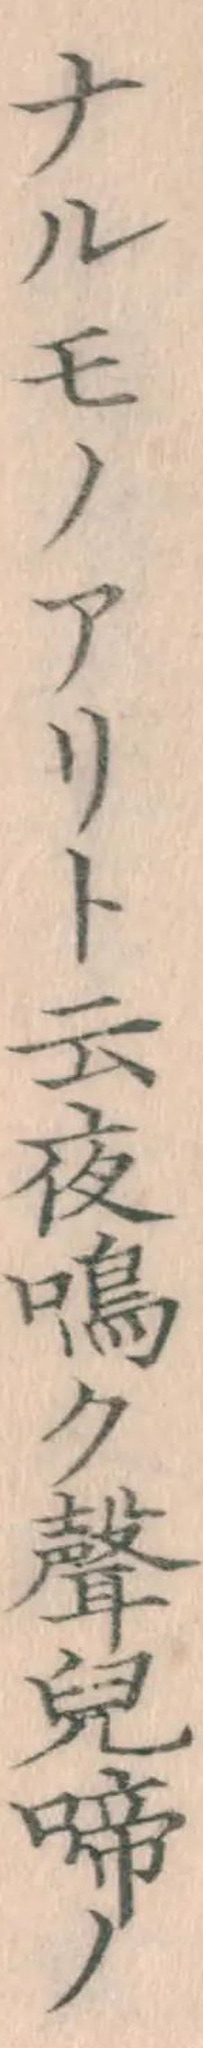ナルモノアリト云夜鳴ク声児啼ノ
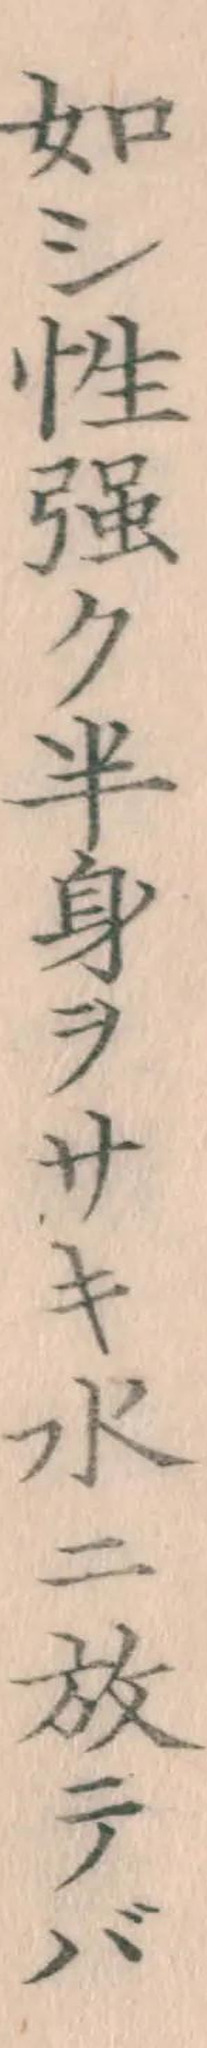如シ性強ク半身ヲサキ水ニ放テバ
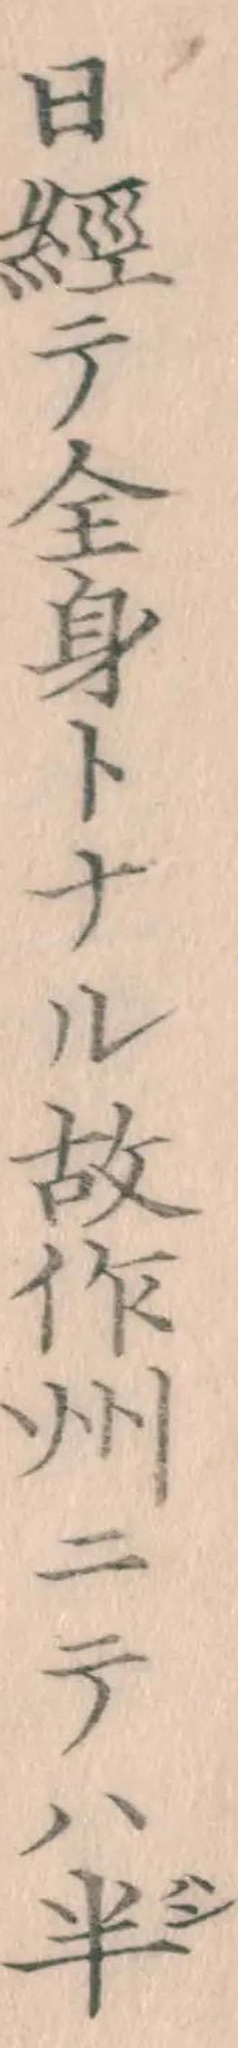日経テ全身トナル故作州ニテハ半
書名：皇和魚譜 2巻
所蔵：国立国会図書館 National Diet Library, JAPAN
